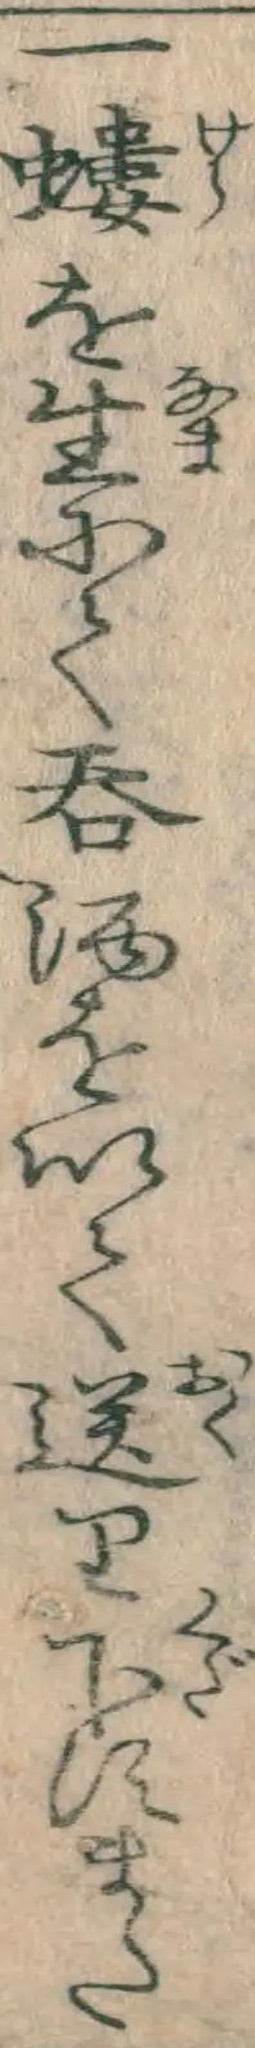一螻を生にて吞酒を以て送り下すまた
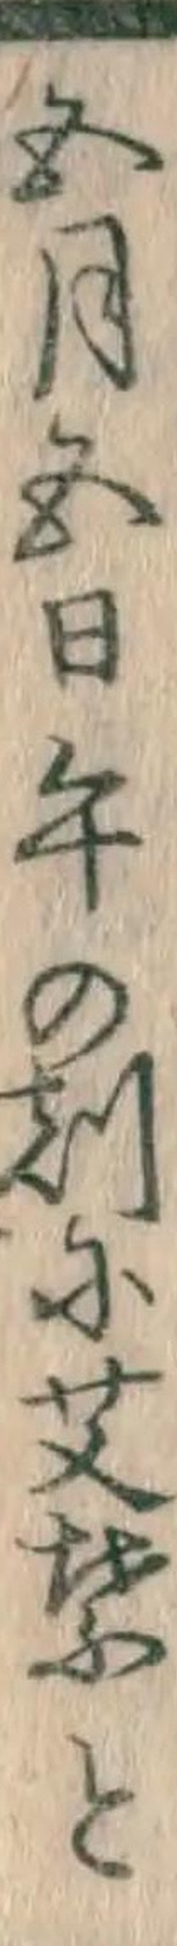五月五日午の刻に艾葉と
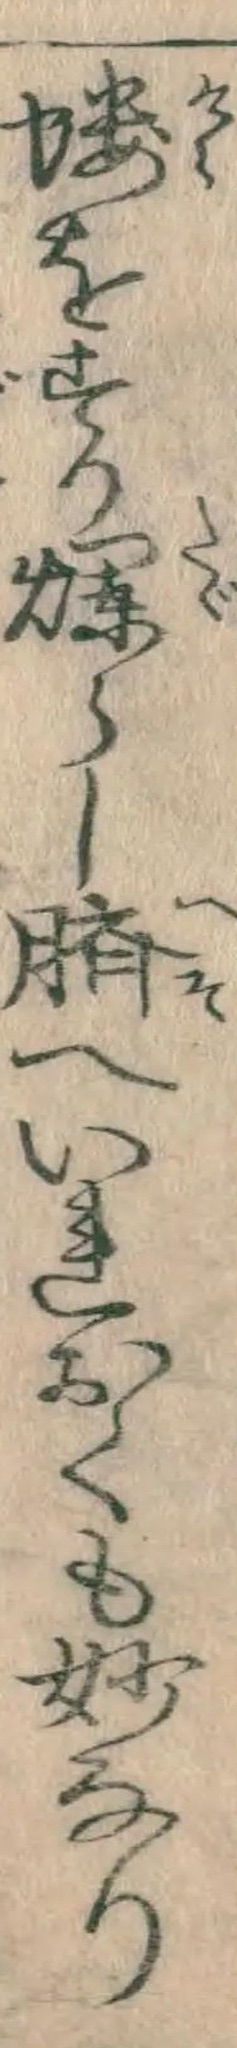螻をすり爛らし臍へいれおくも妙なり
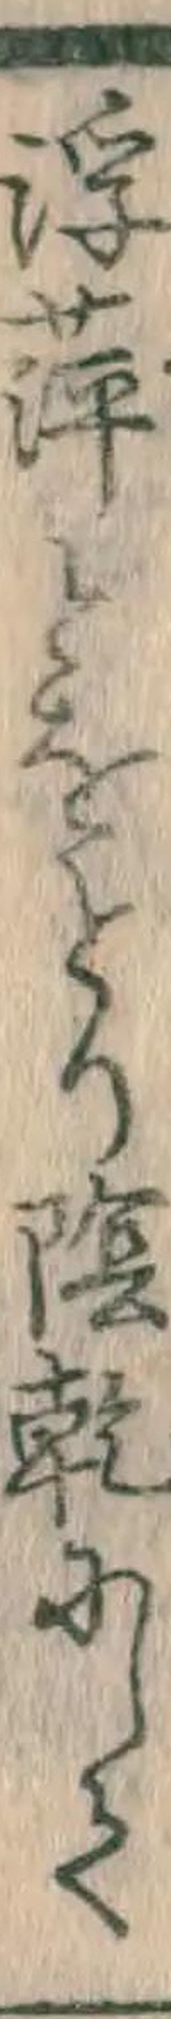浮萍とをとり陰乾にして
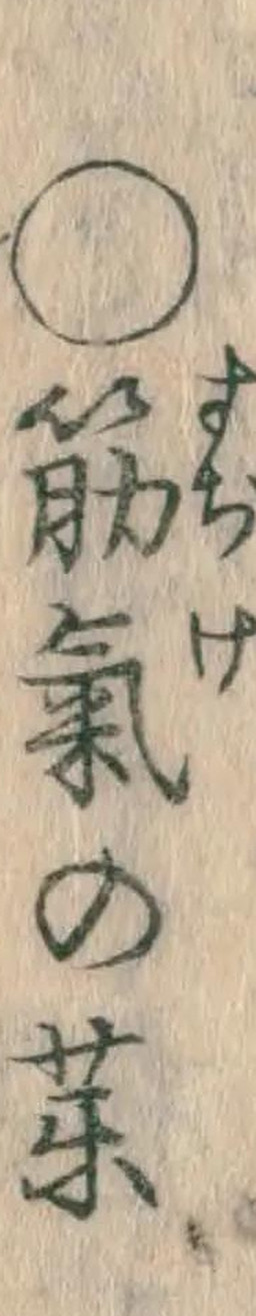○筋気の薬
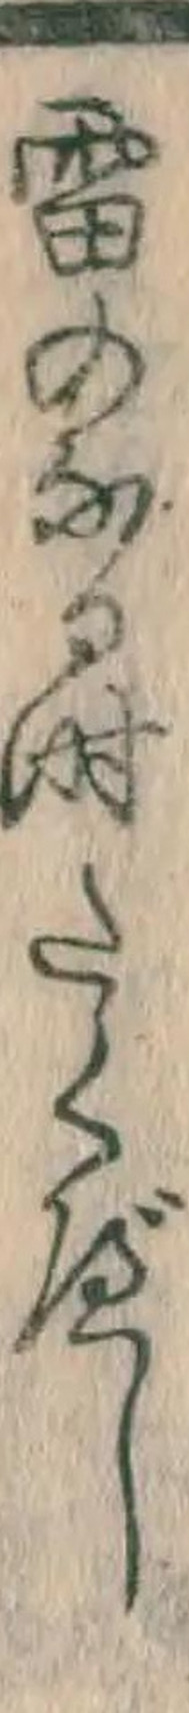雷のなる時たくべし
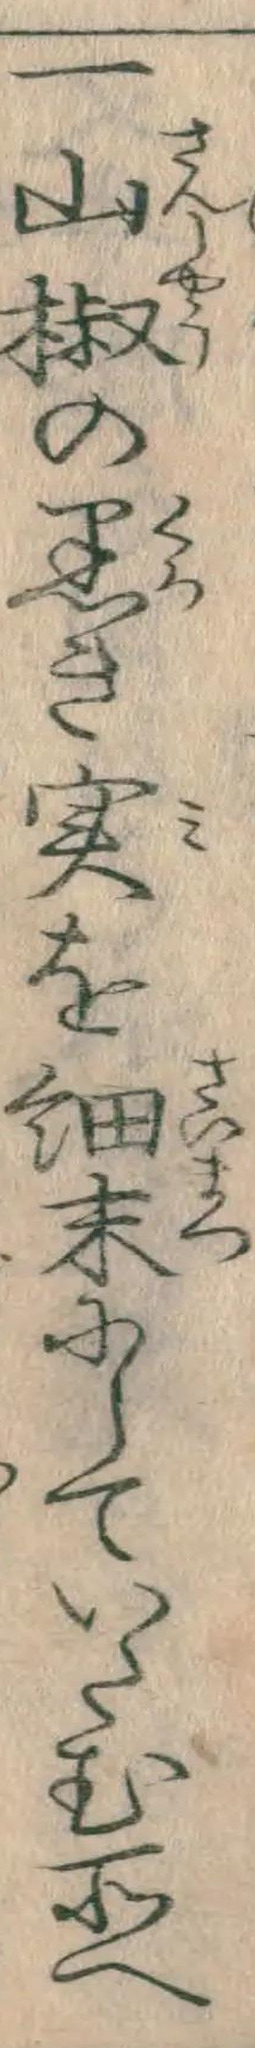一山椒の黒き実を細末にしていたむ所へ
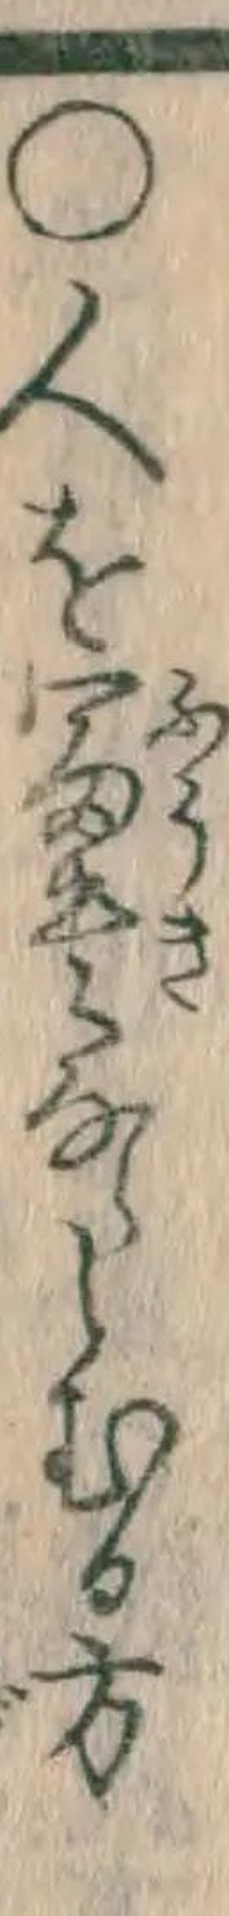○人を富貴ならしむる方
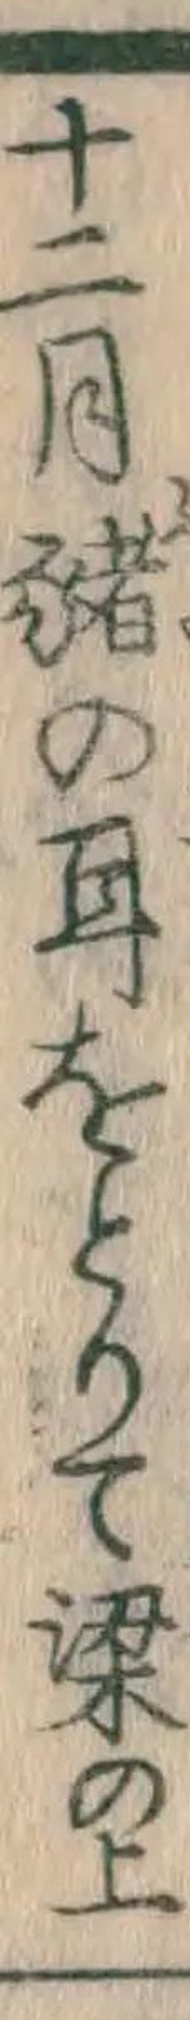十二月豬の耳をとりて梁の上
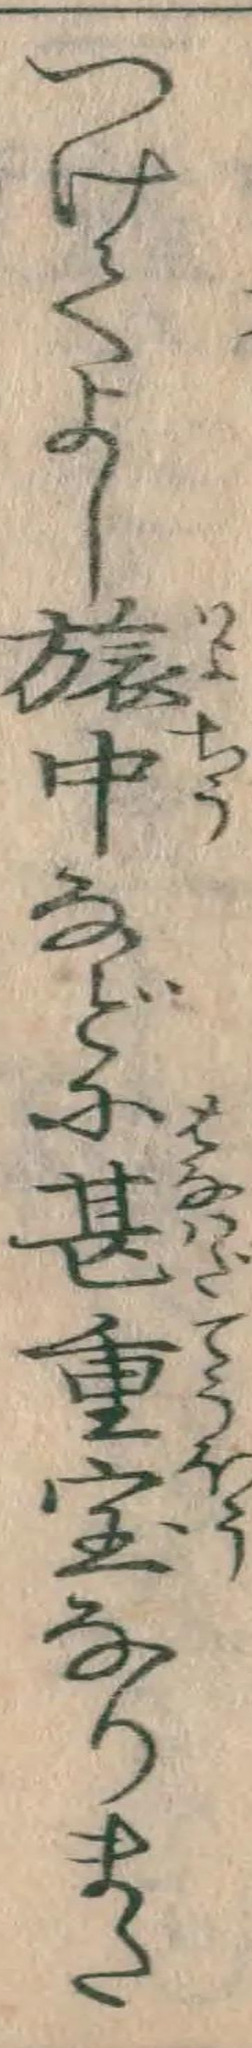つけてよし旅中などに甚重宝なりまた
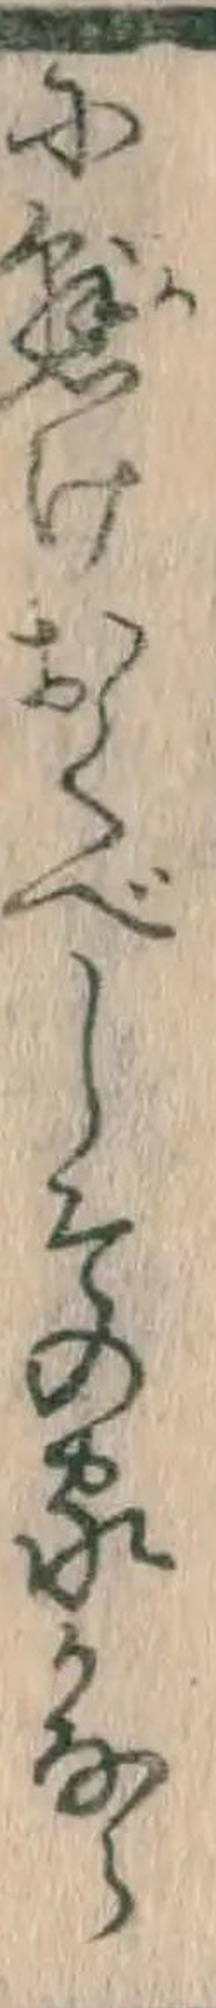に懸けおくべしその家かなら
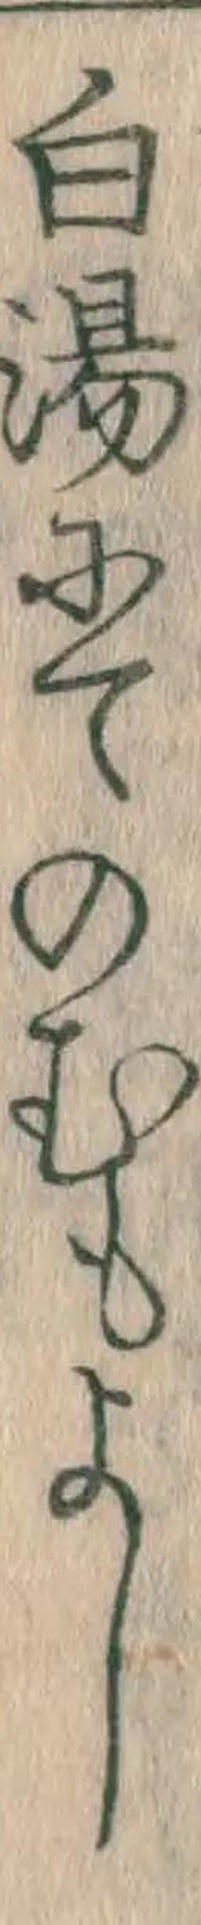白湯にてのむもよし
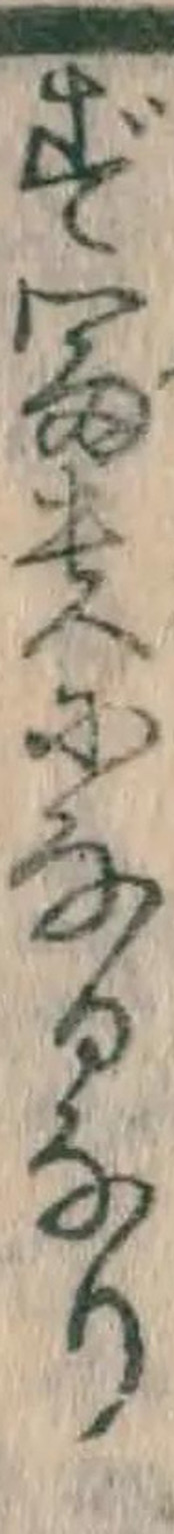ず富貴になるなり
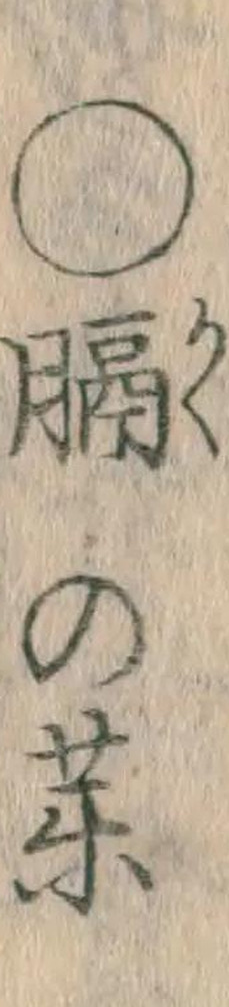○膈の薬
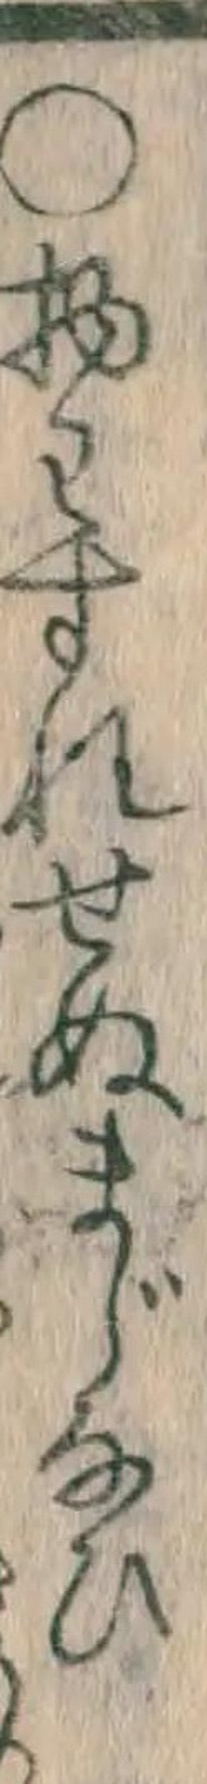○物わすれせぬまじなひ
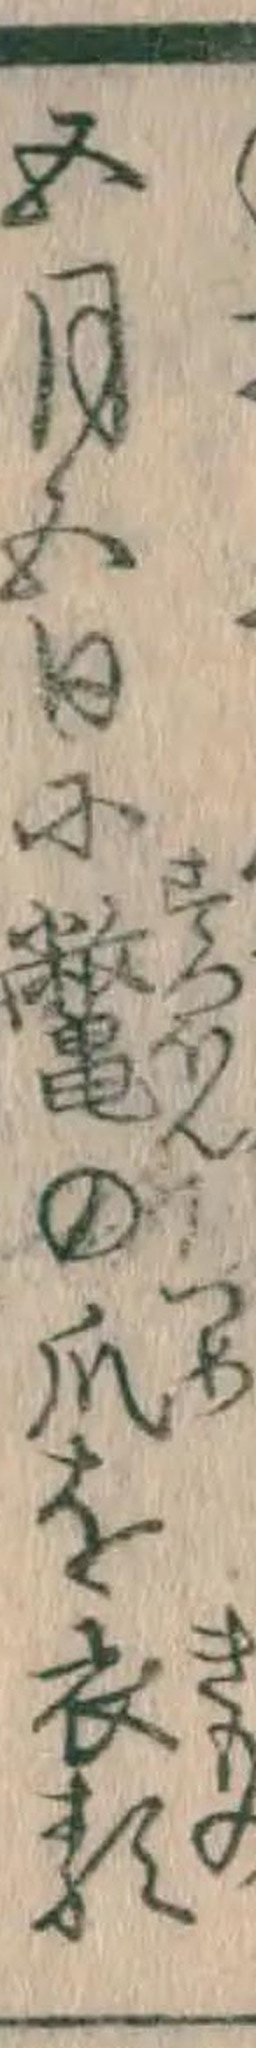五月五日に鼈の爪を衣類
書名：広益秘事大全 3巻. [4]
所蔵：国立国会図書館 National Diet Library, JAPAN
